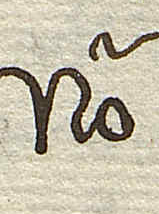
No*
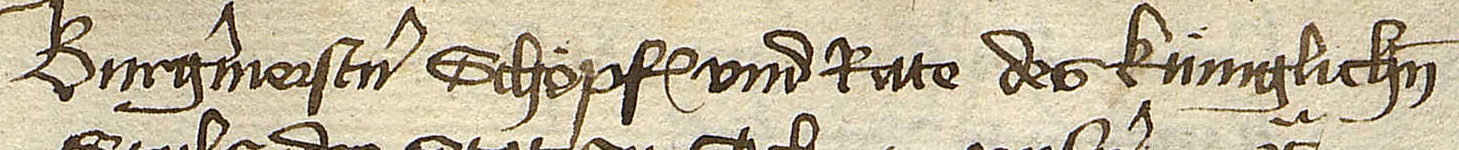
Burg*meiſtn* Schöpf* vnd Rate des küniglichn*
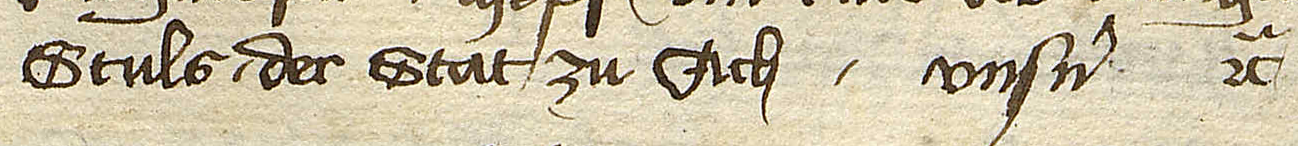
Stuls / der Stat ʒu Ach / vnſn* ec*
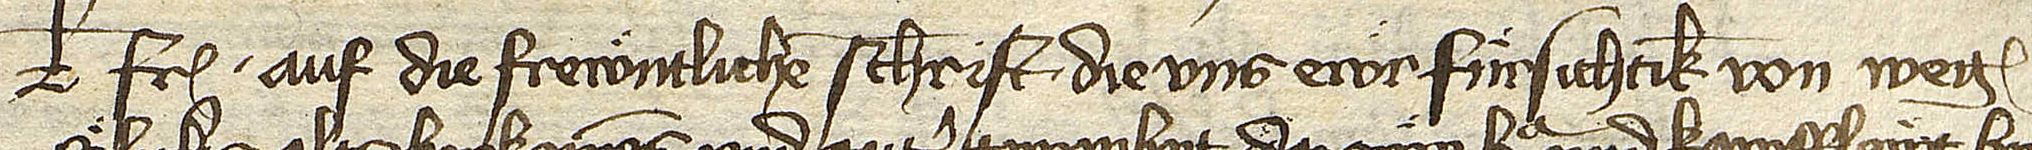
L* Fr* / auf die freẅntliche* ſchrift / die vns eẅr fürſichtik* von weg*
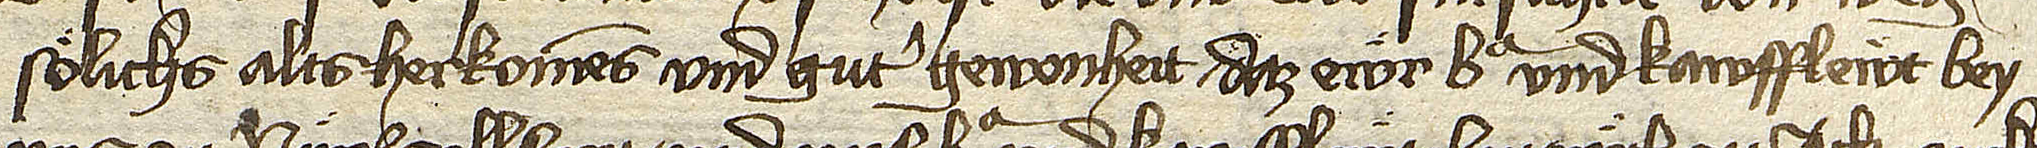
ſölichs alts herkome*s vnd gut* gewonheit / daʒ eẅr b* vnd kawffleẅt bey
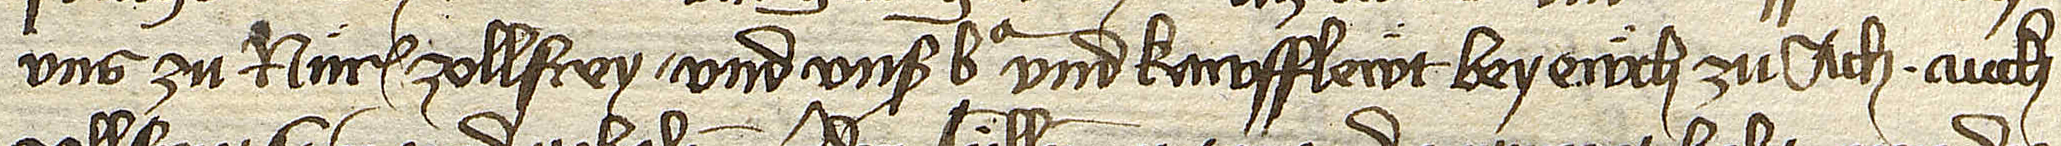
vns ʒu Nür* ʒollfrey / vnd vnſ* b* vnd kawffleẅt bey eẅch ʒu Ach . auch
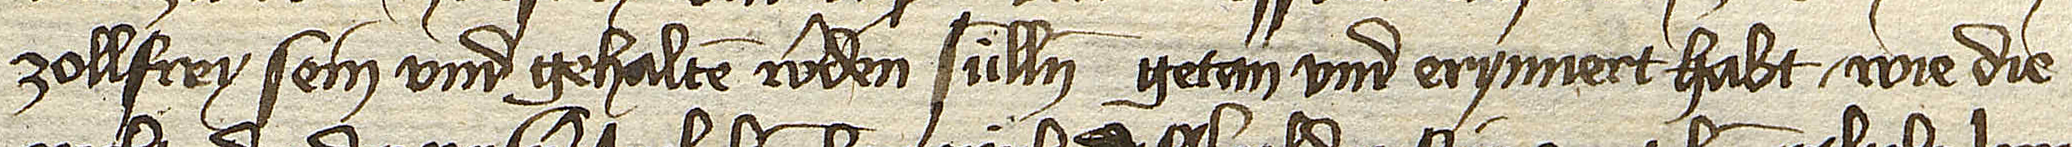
ʒollfrey ſein vnd gehalte* w*den ſülln* getan vnd erynnert habt / wie die
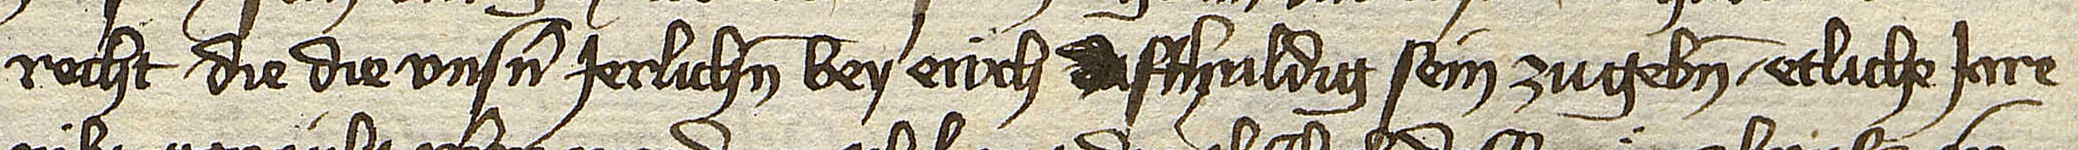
recht / die die vnſn* Ierlichn* bey eẅch %% %%%haldig ſein ʒugebn* / etliche Iare
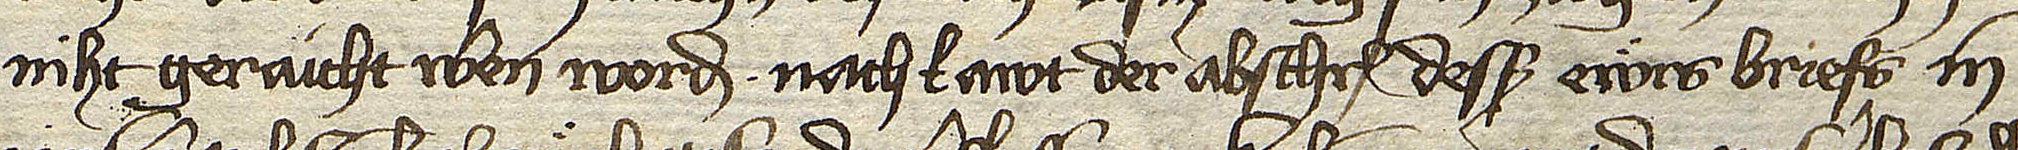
niht geraicht w*en word* . nach lawt der abſchr* deſſ* eẅrs briefs in
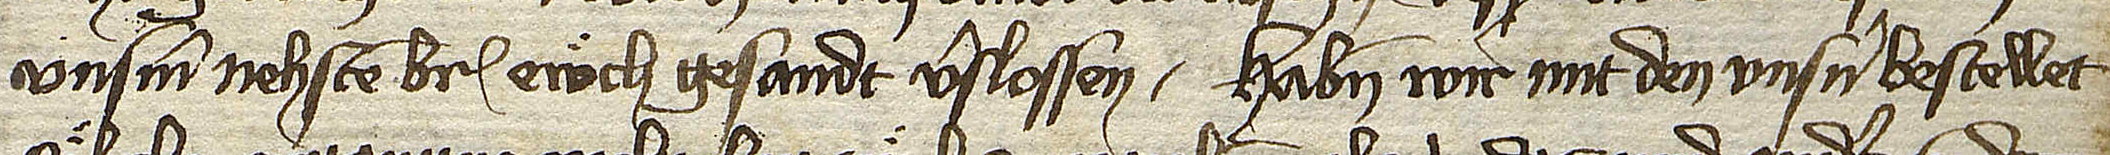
vnſm* nehſte* br* eẅch geſandt v*ſloſſen / Habn* wir mit den vnſn* beſtellet
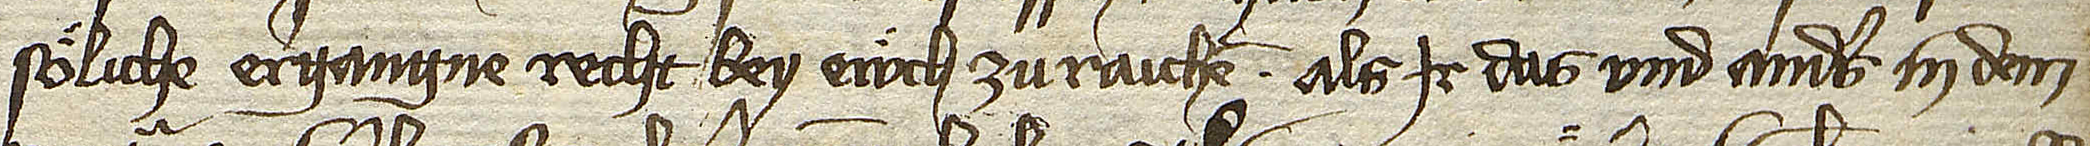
ſöliche ergangne recht bey eẅch ʒu raiche* . als Ir das vnd and*s in dem
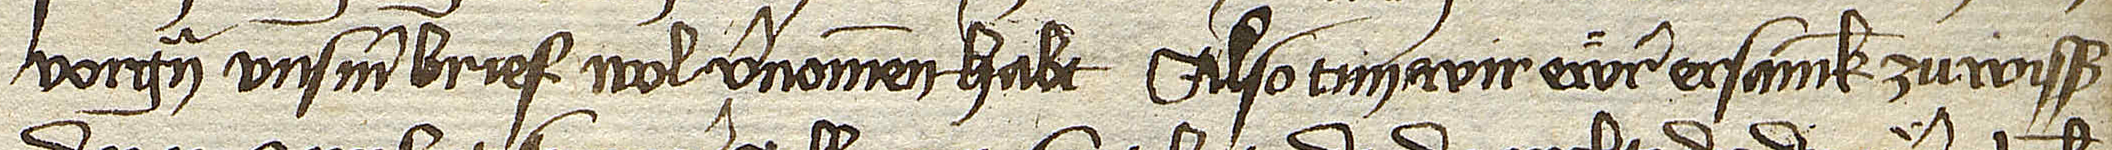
vorgn* vnſm* brief wol v*nom*en habt Alſo tun wir eẅr* erſamk* ʒu wiſſ*
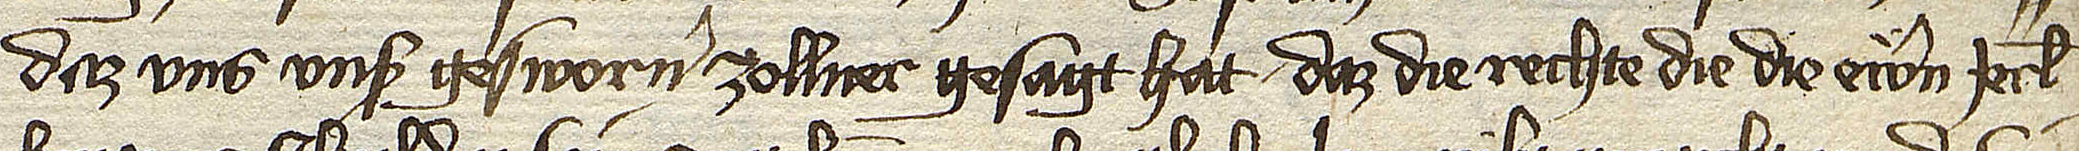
daʒ vns vnſ* geſworn* ʒollner geſagt hat / daʒ die rechte die die eẅ*n Ierl*
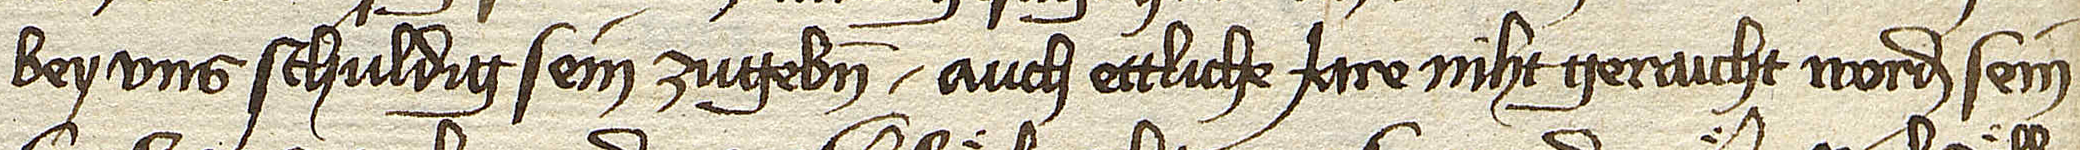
bey vns ſchuldig ſein ʒugebn* / auch ettliche Iare niht geraicht word* ſein
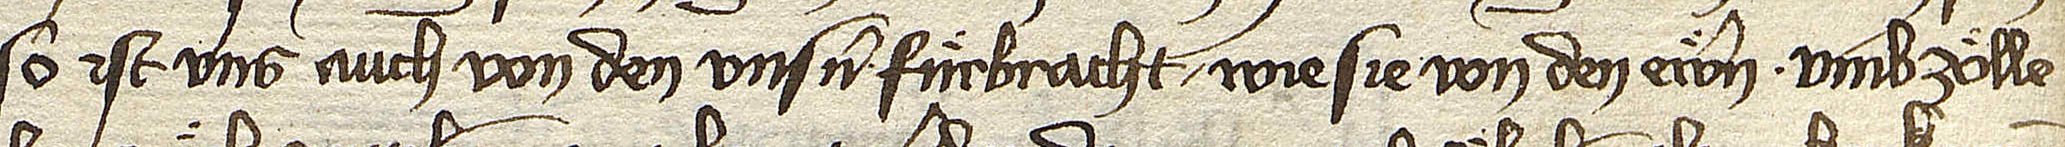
ſo iſt vns auch von den vnſn* fürbracht / wie ſie von den eẅ*n . vmb ʒölle
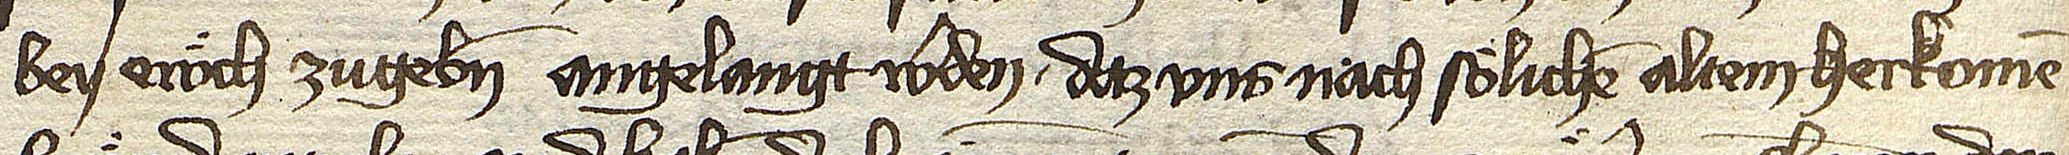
bey eẅch ʒugebn* angelangt w*den / daʒ vns nach ſöliche* altem herkome*
